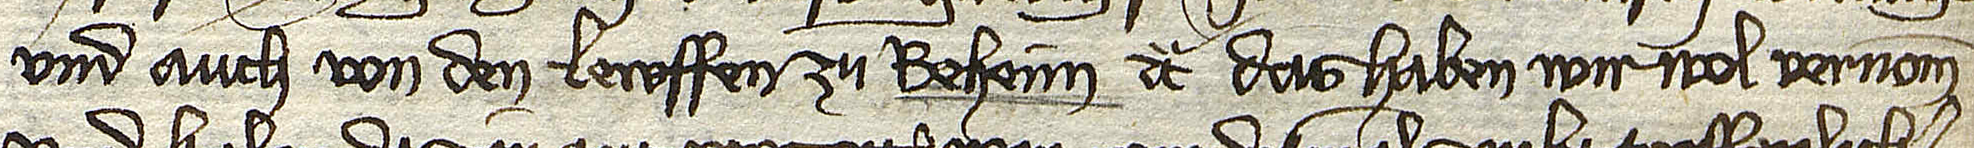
vnd auch von den lewffen ʒu Beheim ec* das haben wir wol vernom*
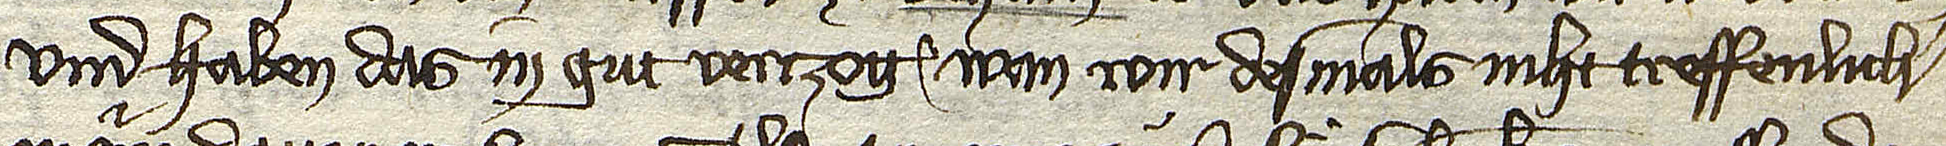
vnd haben das in gut vercʒog* wan wir deſmals niht treffenlich*
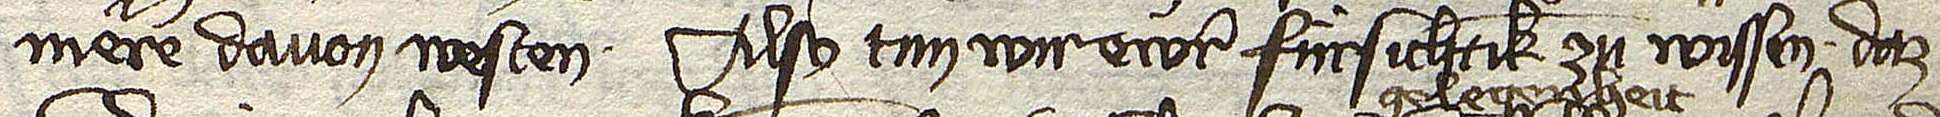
mëre dauon weſten . Alſo tun wir ew*r fürſichtik* ʒu wiſſen . daʒ
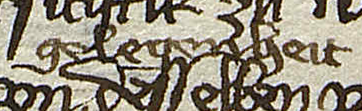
gelegenheit
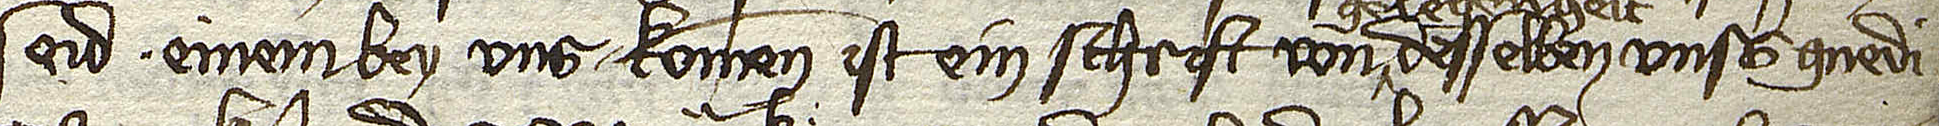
ſeid . einem bey vns / komen* iſt ein ſchrift von deſſelben vnſ*s gnedi
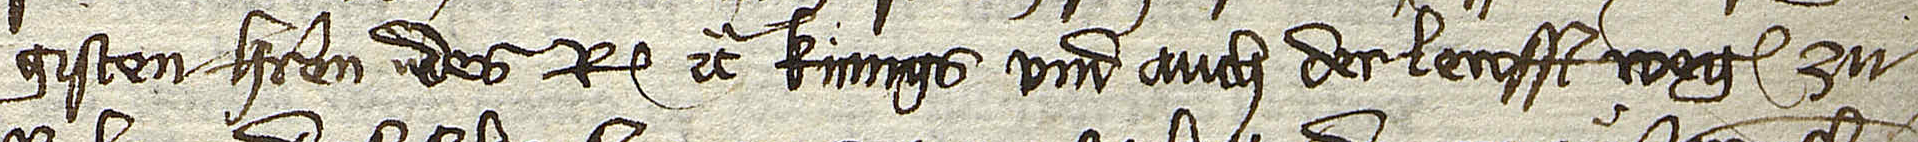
giſten h*ren ~des R* ec* künigs vnd auch der lewfft weg* ʒu
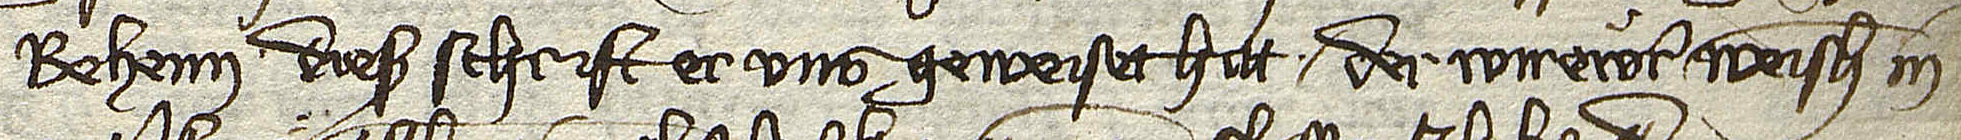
Beheim dieſ* ſchrift er vns geweiſet hat . / der wir ew*r weiſh* in
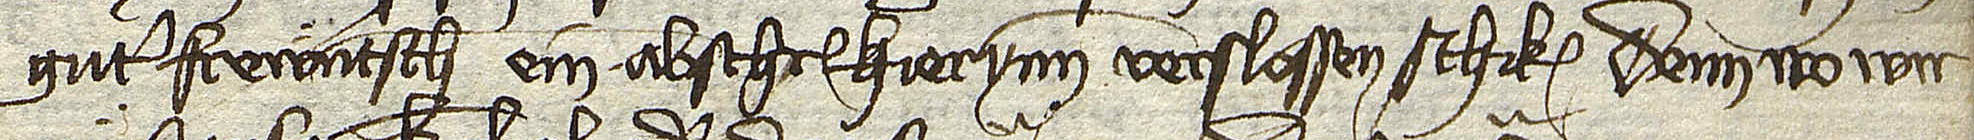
gut* frewntſch* ein abſchr* hierynn* verſloſſen ſchik* / Denn wo wir
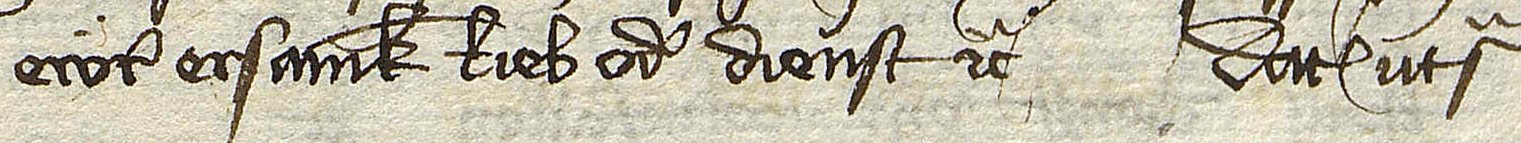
ew*r erſamk* lieb od* dienſt ec* Dat* ut ſ*
